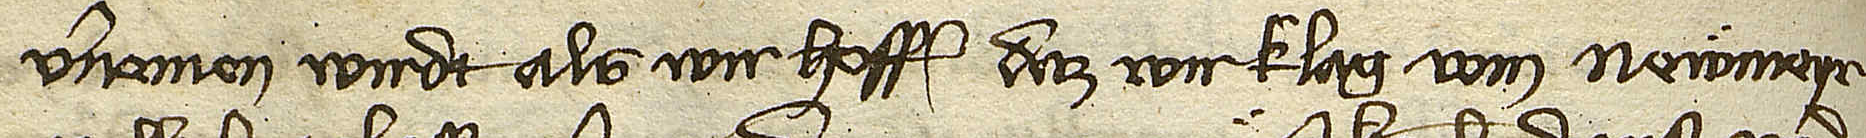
v*nomen wirdt als wir hoff* daʒ wir klag vom Neẅmeyr
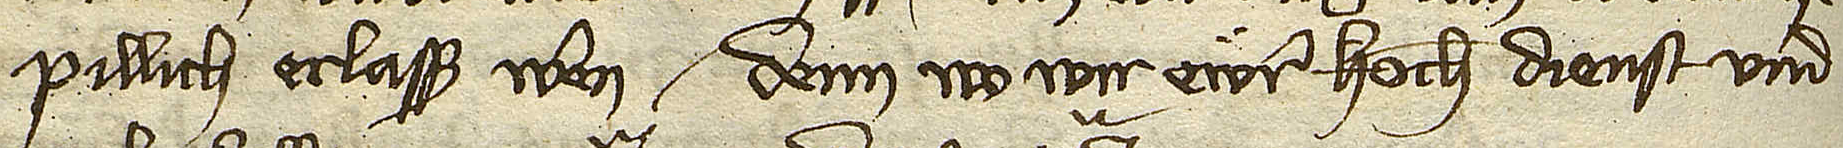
pillich erlaſſ* w*en / Denn wo wir eẅr* hoch* dienſt vnd
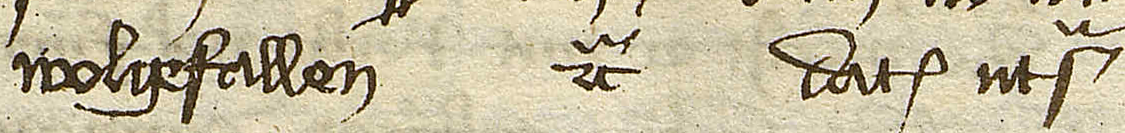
wolgefallen ec* Dat* ut ſ*
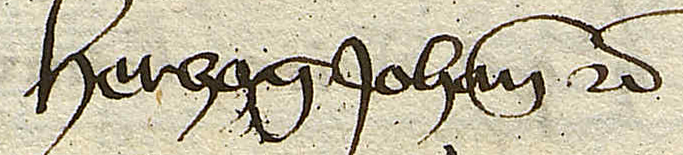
Hercʒog Iohan* ec*
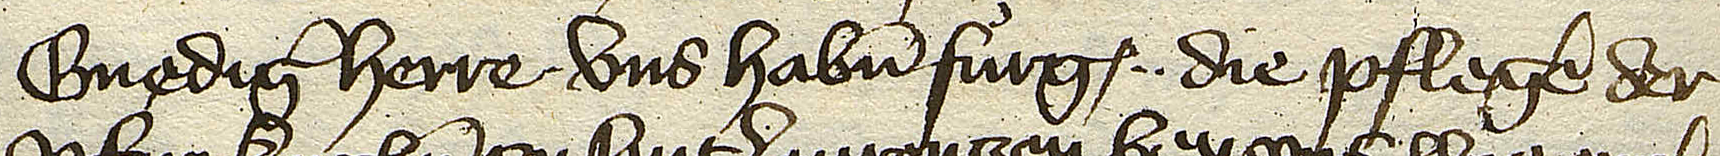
Gnedig* herre Vns hab*n fürg* ~ die pflege* der
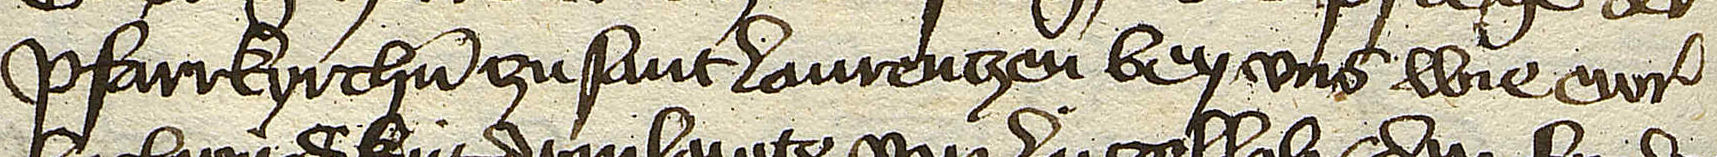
pfarrkyrch*n cʒu ſant Laurencʒen bey vns wie ewr*
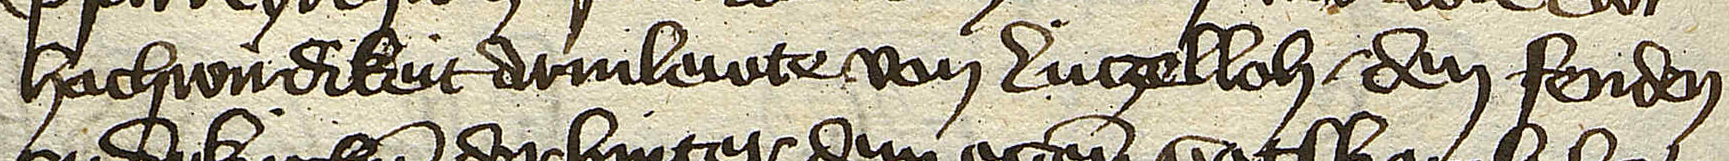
hochwirdigkeit Armlewte von Lücʒelloh / den fenden
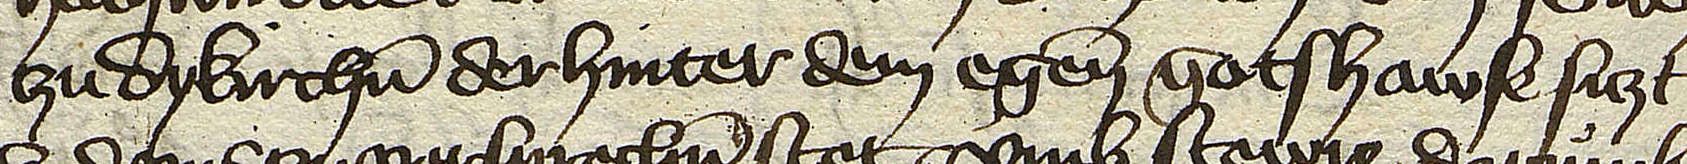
cʒu Dykirch*n der hinter dem egen* gothawſe ſicʒt
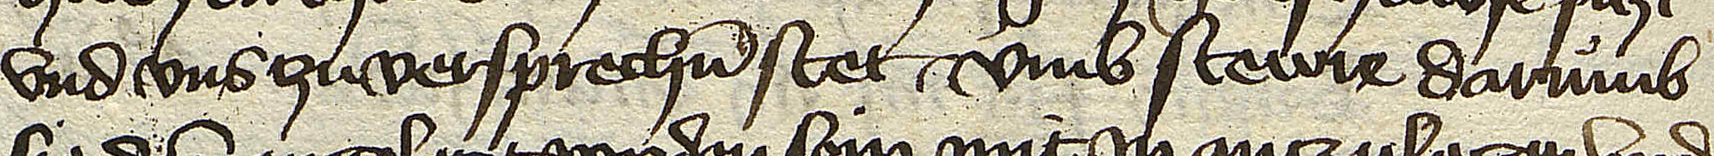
vnd vns cʒu verſprech*n ſtet / vmb ſtewre darümb
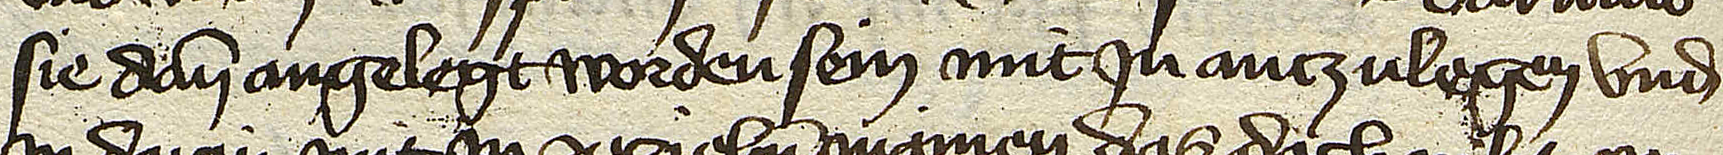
ſie dan* angelegt worden ſein mit In ancʒulegen vnd
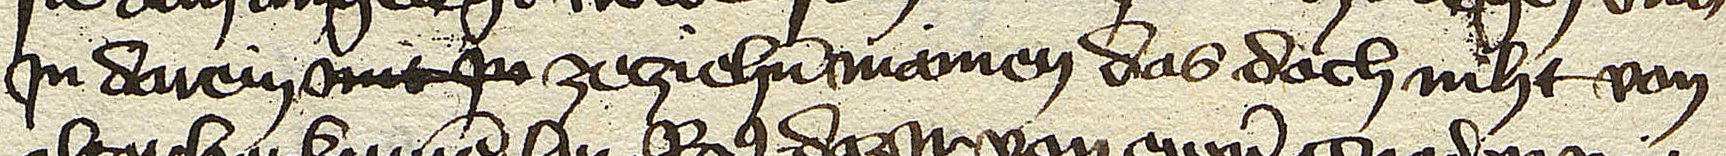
In darein mit In ʒecʒieh*n mainen das doch niht von
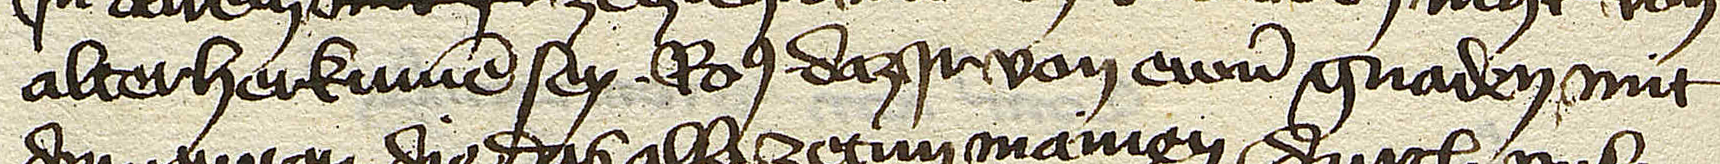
alterherkume* ſey . Ro* daʒ Ir von ew*n gnaden mit
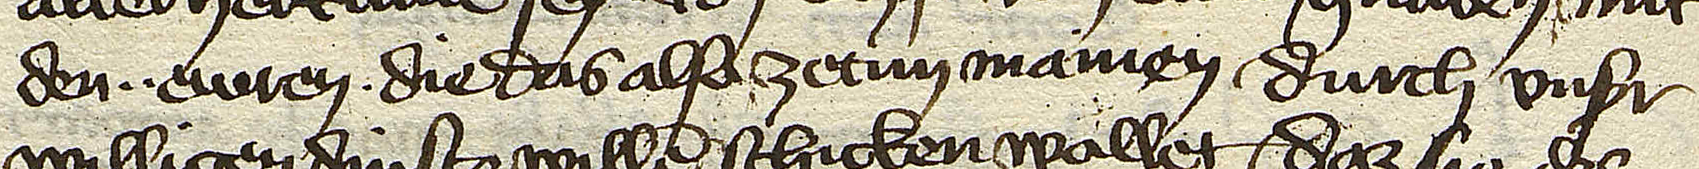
den ~ ewren . die das alſo cʒetun mainen / durch vnſ*r
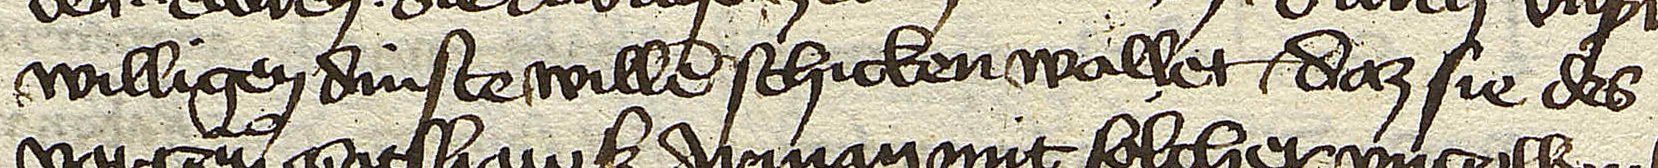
willigen dinſte wille* ſchicken wollet / daʒ ſie des
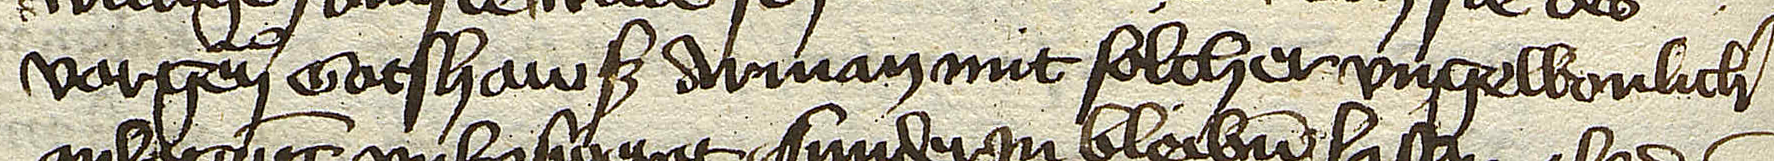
vorgen* Gotſhawſʒ Arman mit ſölcher vngewonlich*
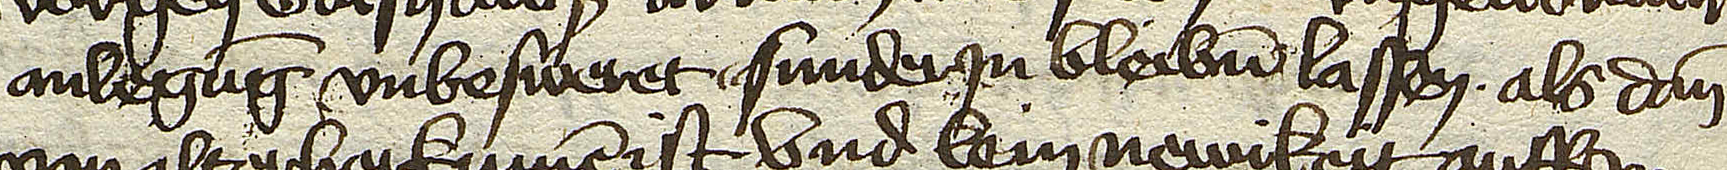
anlegu*g vnbeſweret / ſunder In bleib*n laſſen . als dan*
